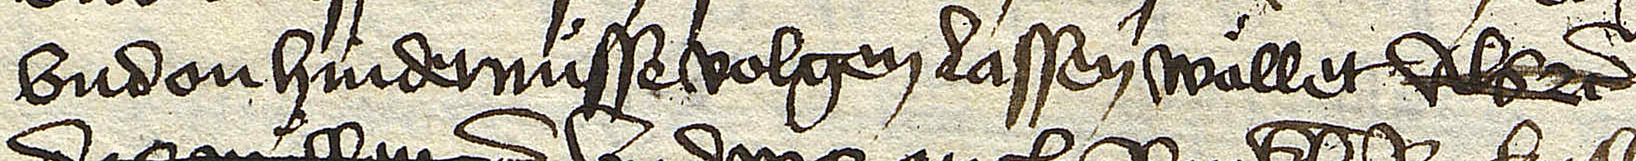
vnd on hindernüſſe volgen laſſen wöllet Als ec*
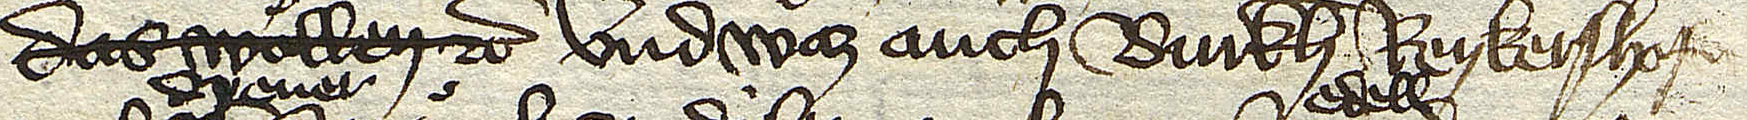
das wöllen ec* vnd waʒ auch Burkh* Reykerſhof*
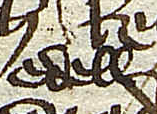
edell
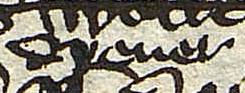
dyener
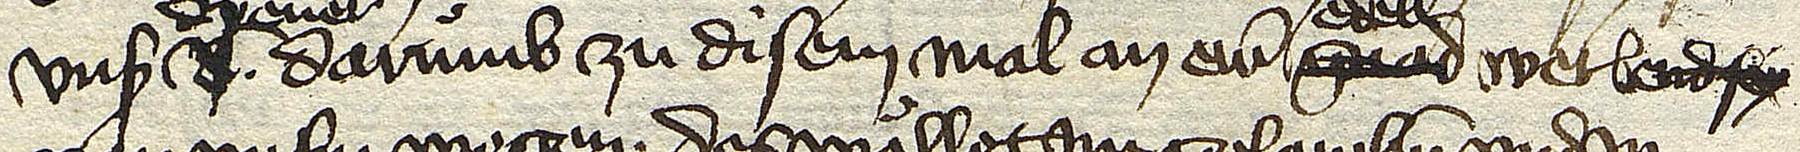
vnſ* B . darümb cʒu diſem mal an ew* gnad werbend ſey
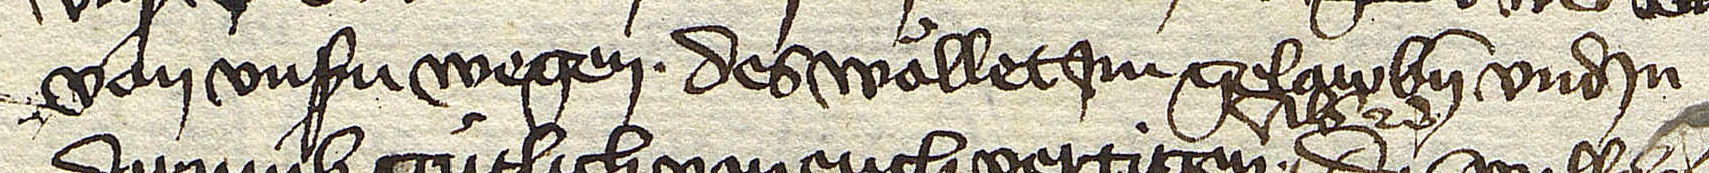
von vnſ*n wegen . des wöllet Im gelawbn* vnd In
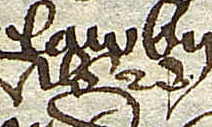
Als ec*
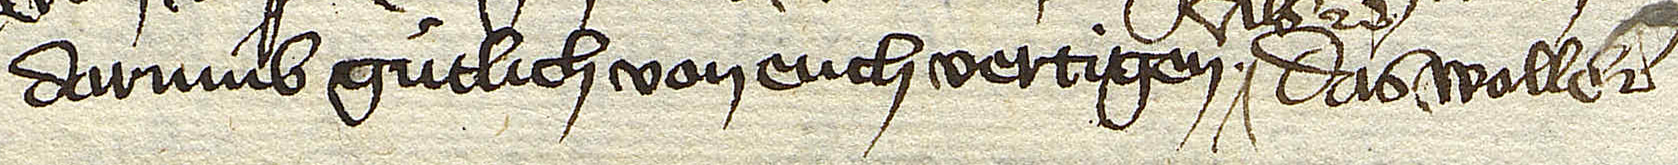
darumb gütlich von euch vertigen . Das wolle* ec*
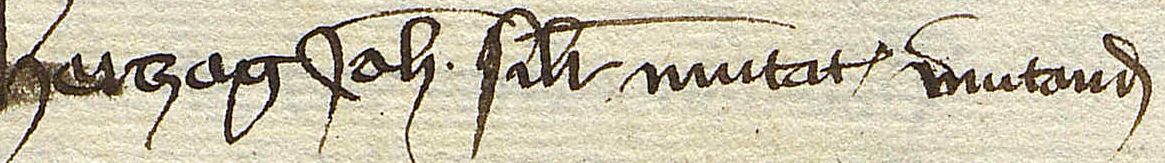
hercʒog Ioh.* ſilr* mutat* mutand*
